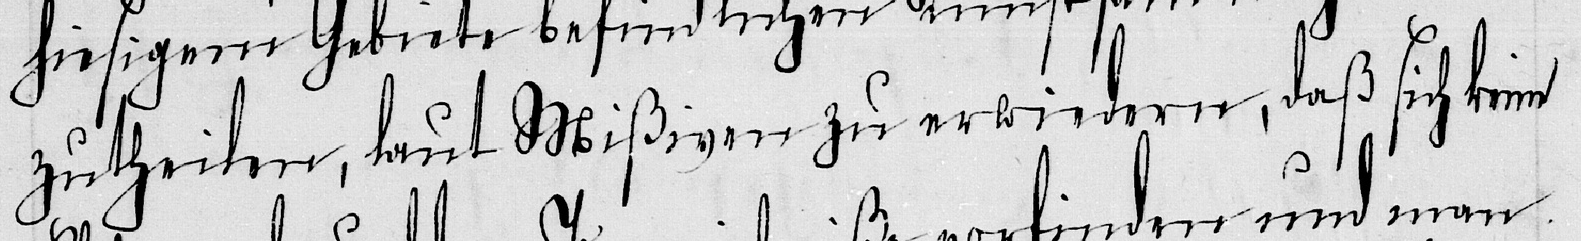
zutheilen, laut Mißiven zu erwiedern, daß sich keine
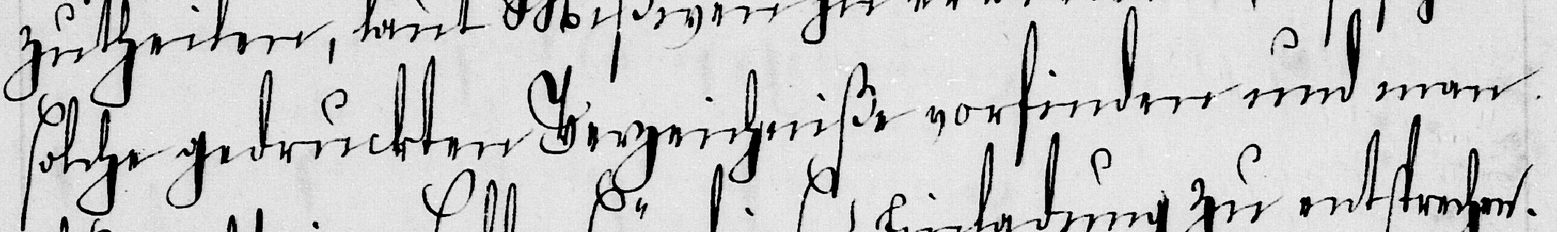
solche gedruckten Verzeichniße vorfinden und man
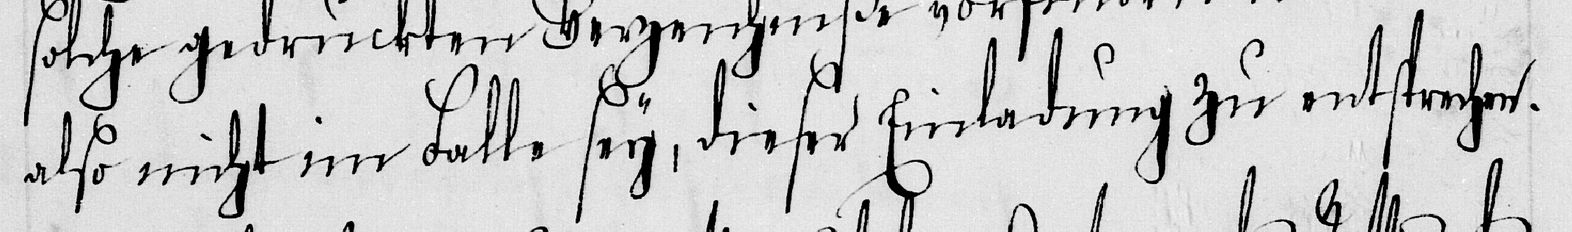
also nicht im Falle sey, dieser Einladung zu entsprechen.
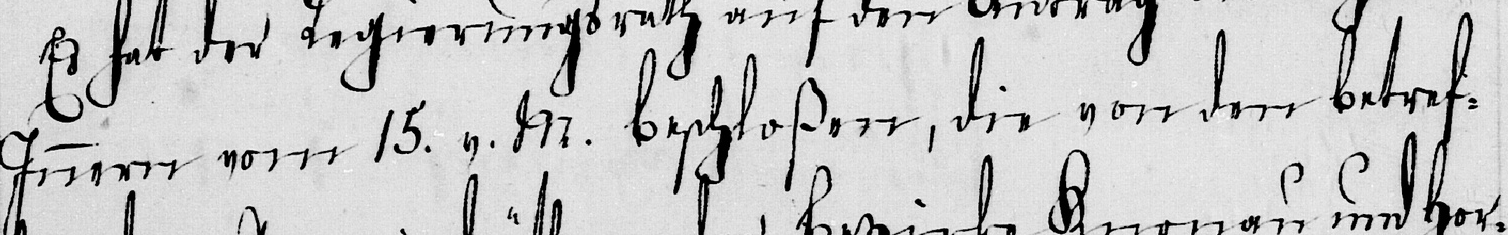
Innern vom 15. v. M. beschloßen, die von den betref¬
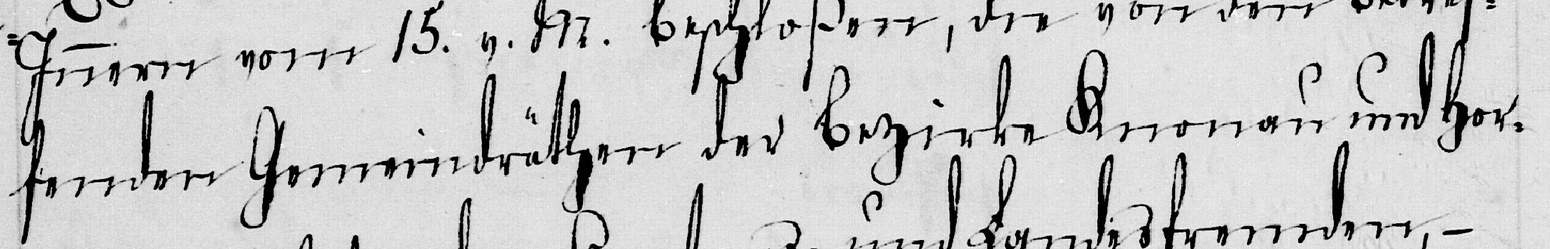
fenden Gemeindräthen der Bezirke Knonau und Hor¬
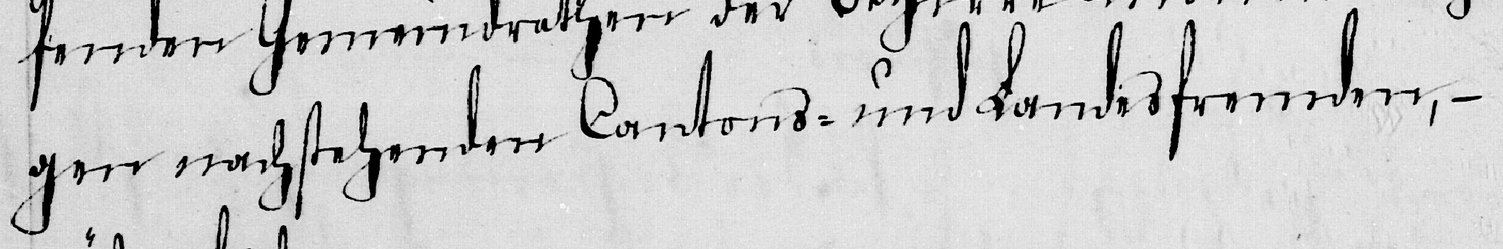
gen nachstehenden Cantons- und Landesfremden, –
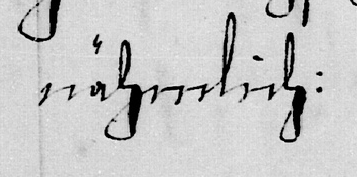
nähmlich:
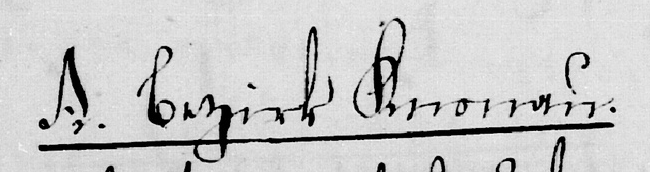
A. Bezirk Knonau.
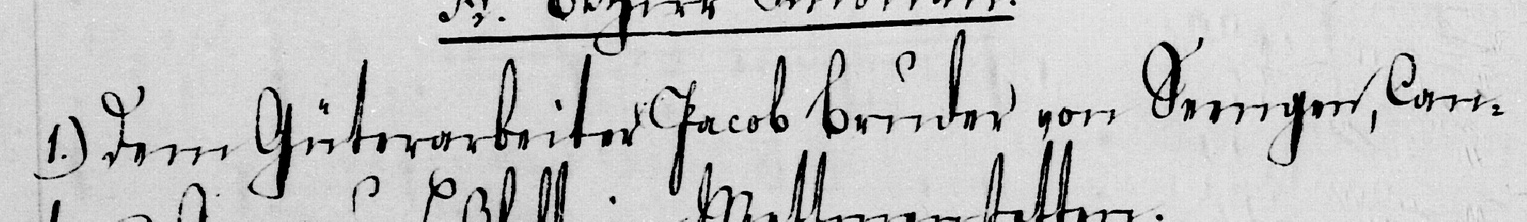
1.) Dem Güterarbeiter Jacob Bruder von Seengen, Can¬
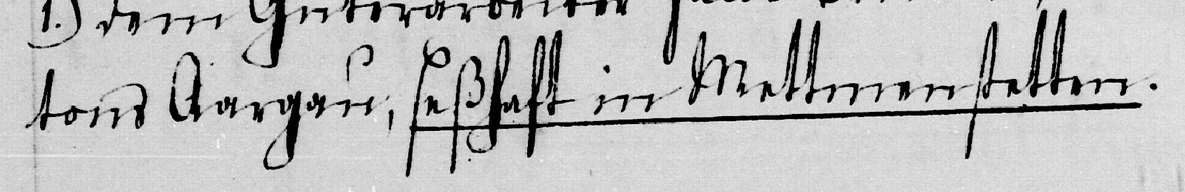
tons Aargau, seßhaft in Mettmenstetten.
